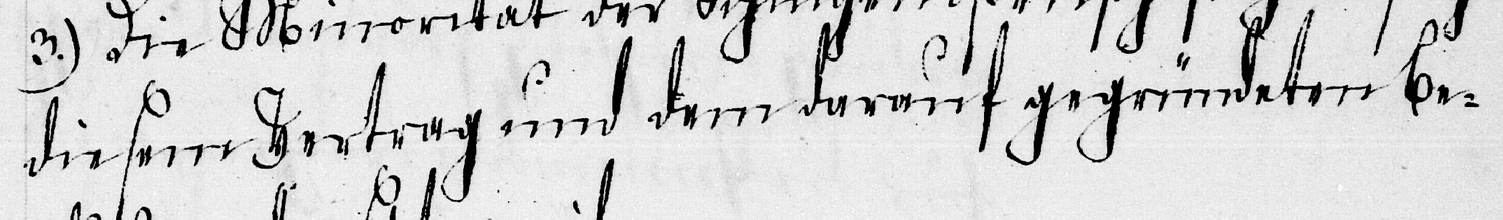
diesem Vertrag und dem darauf gegründeten Be¬
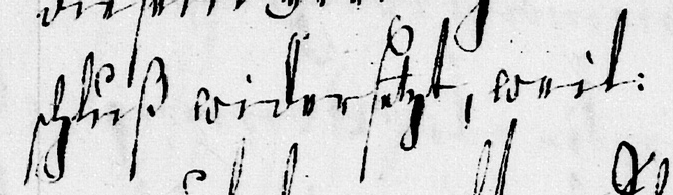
schluß widersetzt, weil:
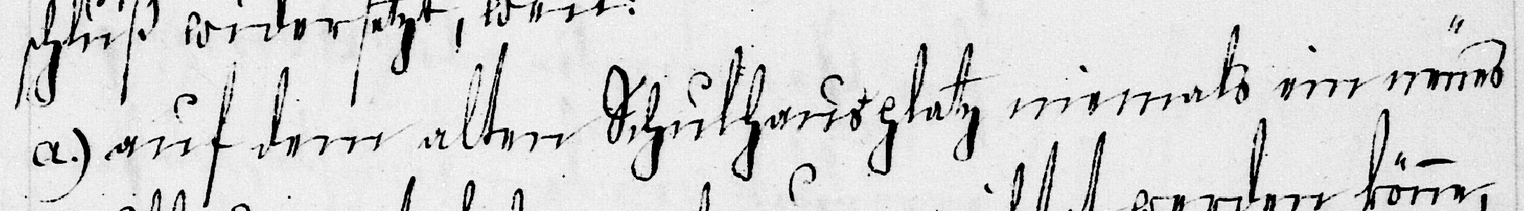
a.) auf dem alten Schulhausplatz niemals ein neues
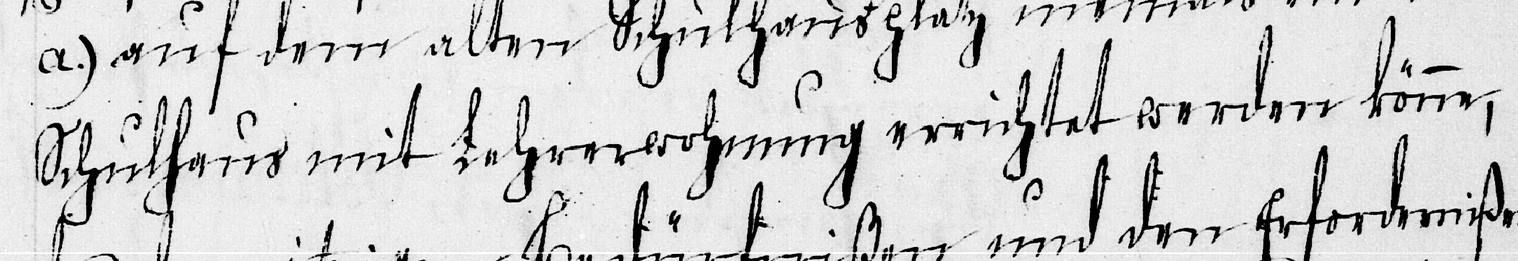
Schulhaus mit Lehrerwohnung errichtet werden könne,
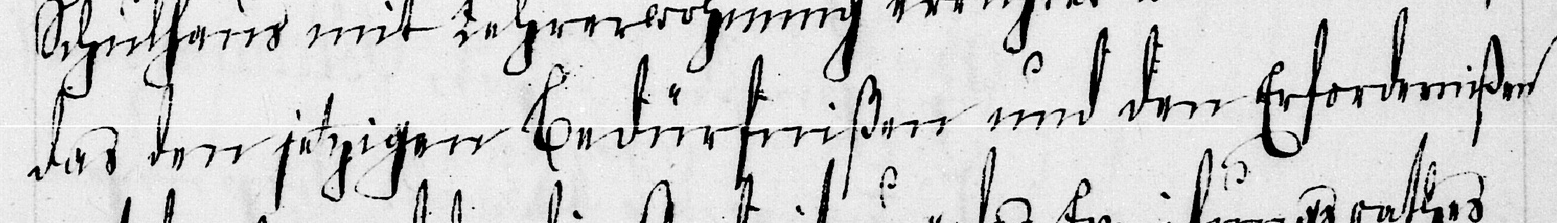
das den jetzigen Bedürfnißen und den Erfordernißen
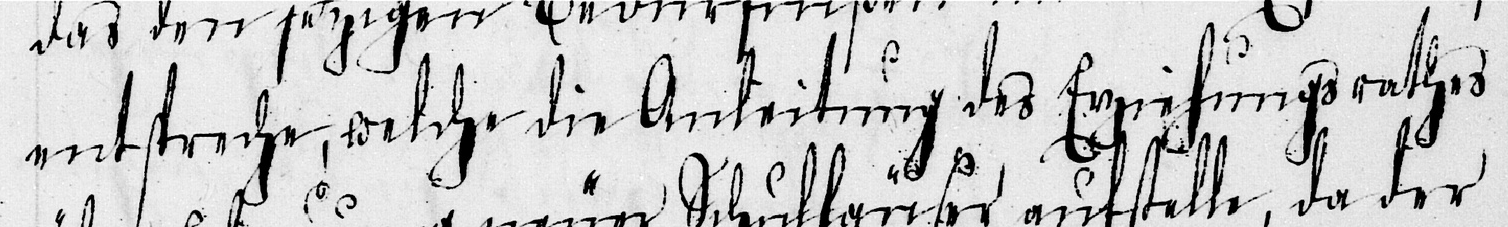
entspreche, welche die Anleitung des Erziehungsrathes
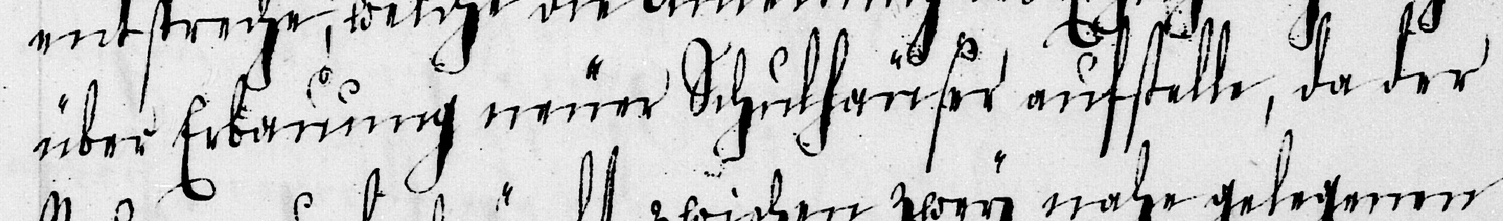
über Erbauung neuer Schulhäuser aufstelle, da der
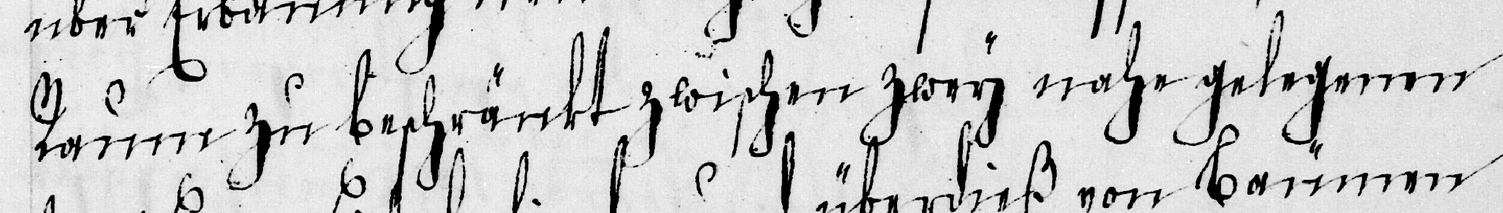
Raum zu beschränkt zwischen zwey nahe gelegenen
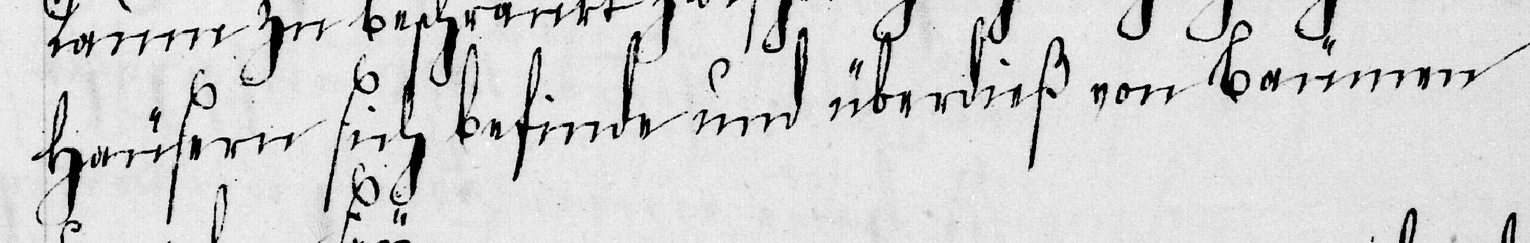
Häusern sich befinde und überdieß von Bäumen
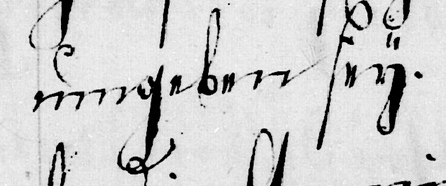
umgeben sey.
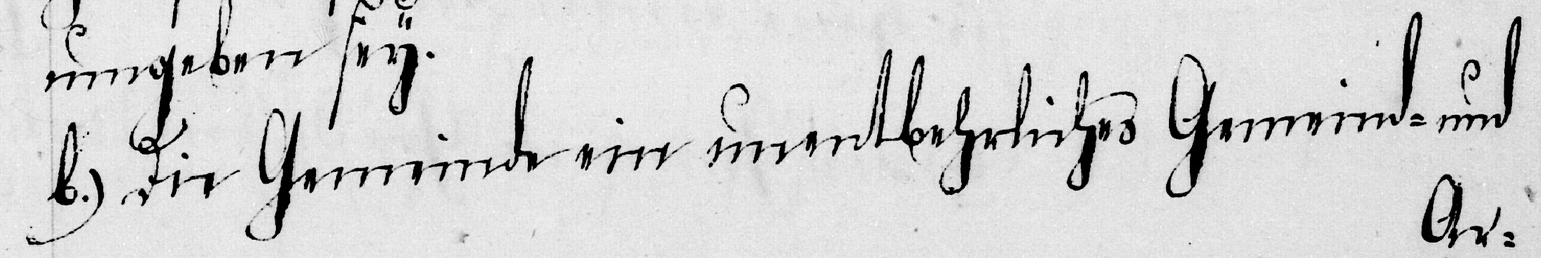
b.) Die Gemeinde ein unentbehrliches Gemeind- und
